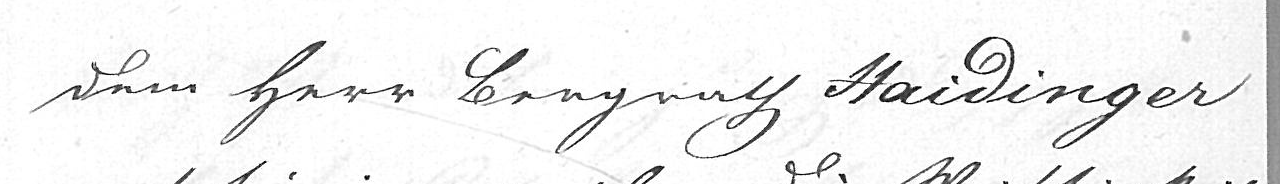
dem Herr Bergrath Haidinger
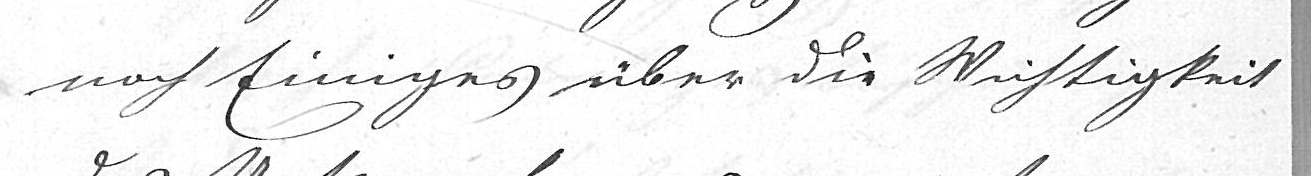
noch einiges über die Wichtigkeit
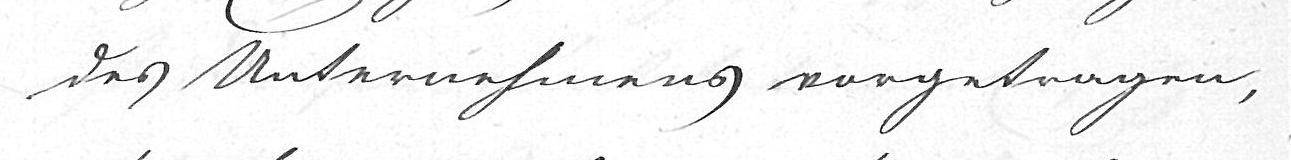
des Unternehmens vorgetragen,
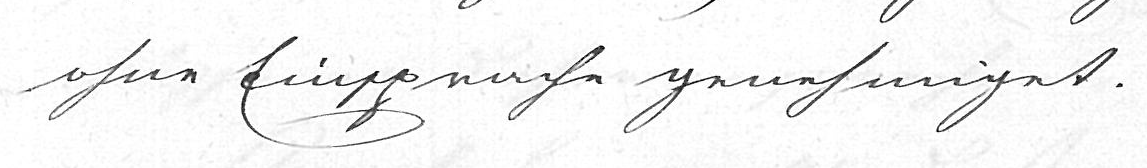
ohne Einsprache genehmiget.
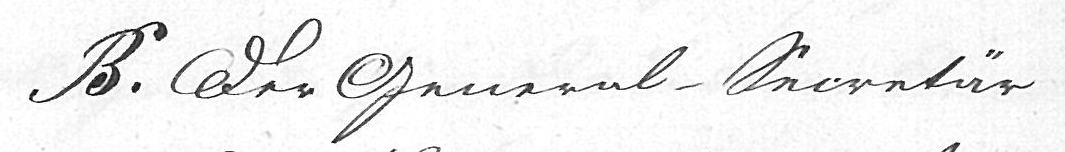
B. Der General-Secretär
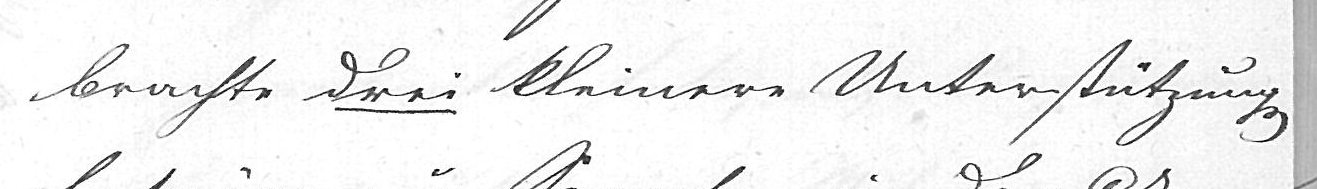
brachte drei kleinere Unterstützungs-
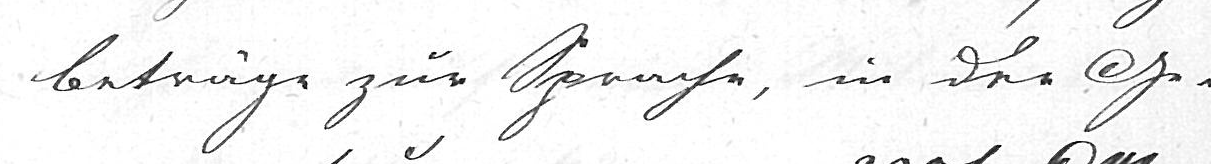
Beträge zur Sprache, in der Ge-
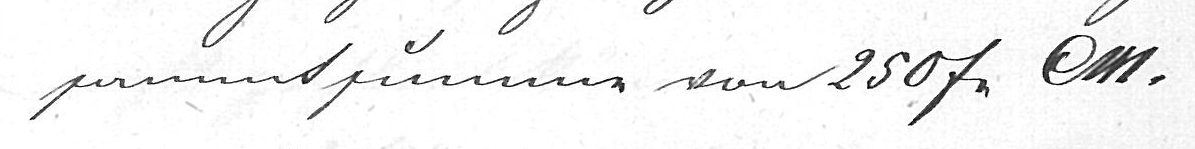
sammtsumme von 250 fl CM-
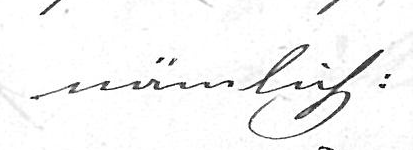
nämlich:
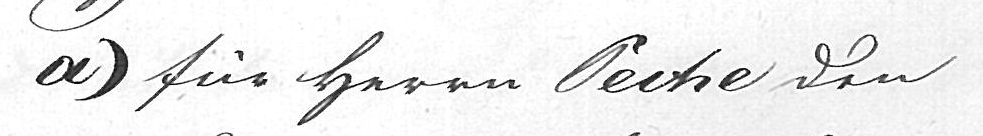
a) für Herrn Peche den
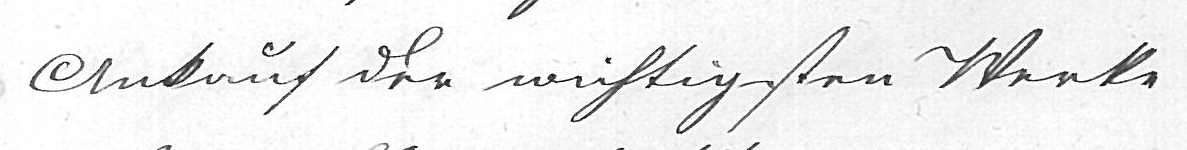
Ankauf der wichtigsten Werke
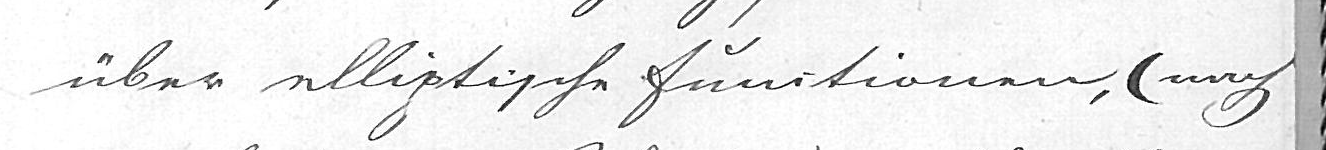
über elliptische Functionen, (nach
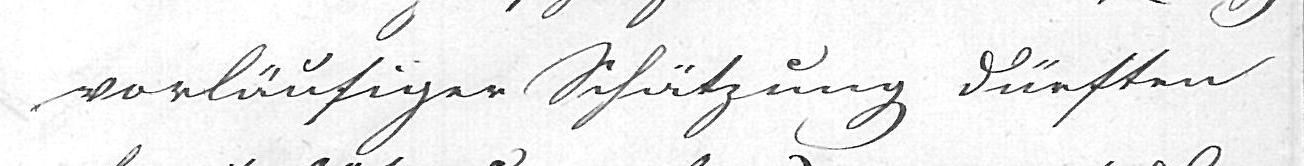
vorläufiger Schätzung dürften
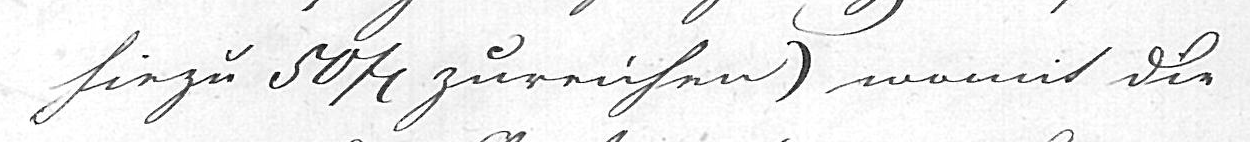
hiezu 50 fl zureichen) womit die
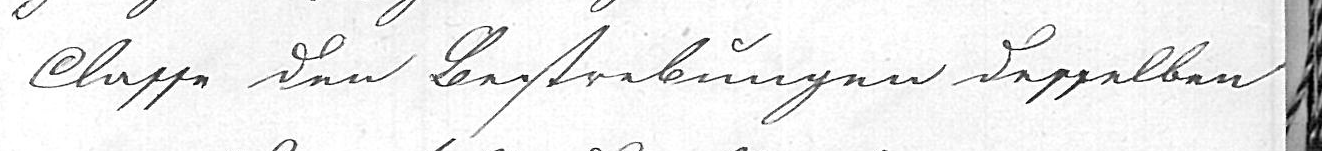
Classe den Bestrebungen desselben
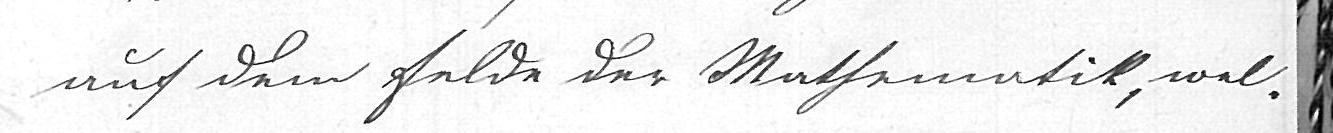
auf dem Felde der Mathematik, wel-
